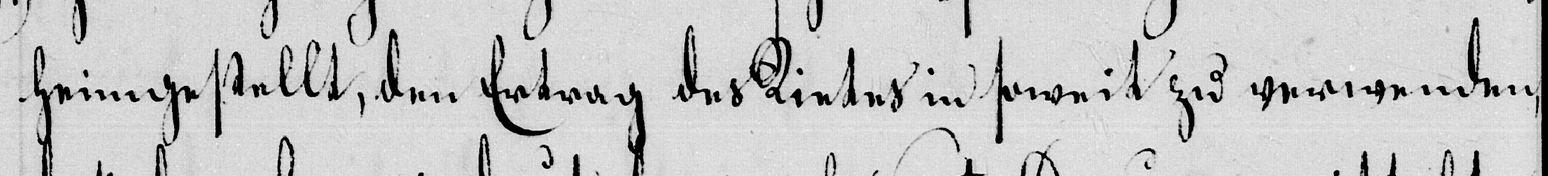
heimgestellt, den Ertrag des Rietes in soweit zu verwenden,
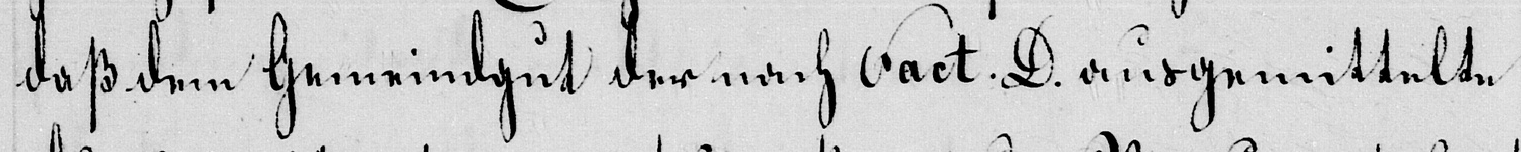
daß dem Gemeindgut der nach Fact. D. ausgemittelte
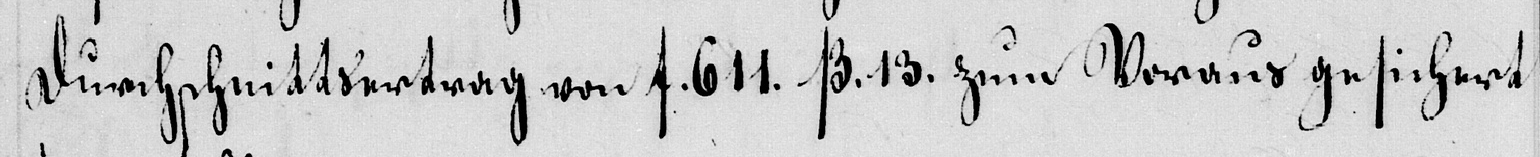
Durchschnittsertrag von f. 611. ß. 13. zum Voraus gesichert
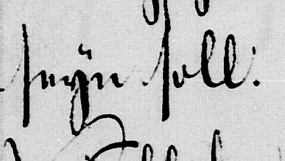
seyn soll.
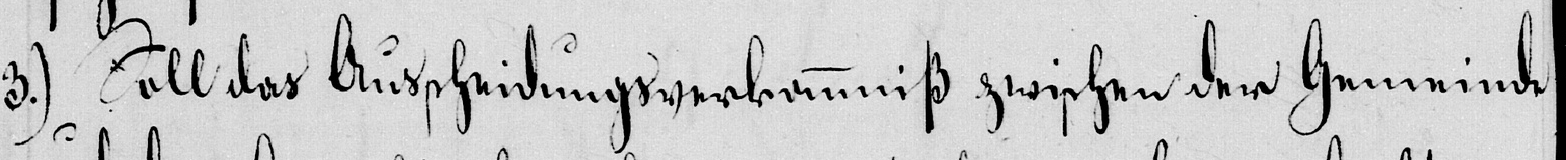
3.) Soll das Ausscheidungsverkommniß zwischen der Gemeinde
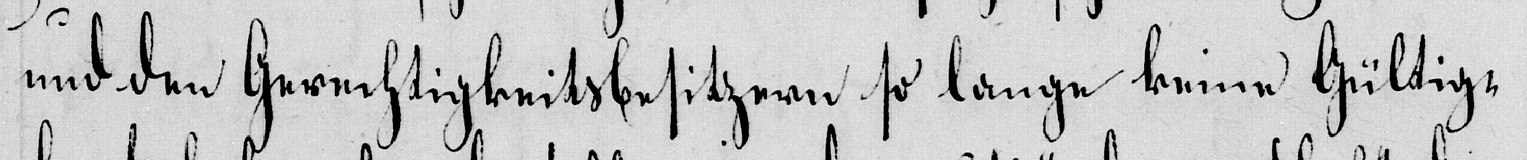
und den Gerechtigkeitsbesitzern so lange keine Gültig¬
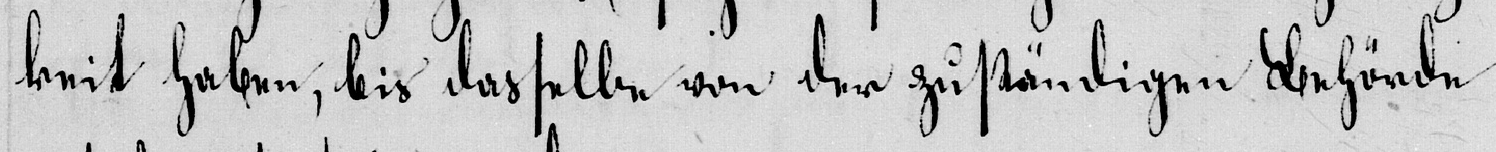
keit haben, bis dasselbe von der zuständigen Behörde
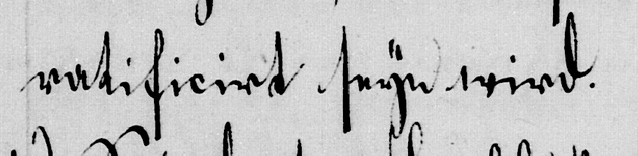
ratificirt seyn wird.
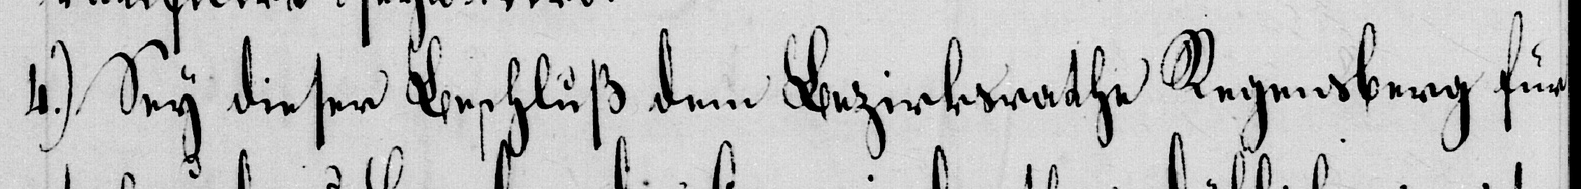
4.) Sey dieser Beschluß dem Bezirksrathe Regensberg für
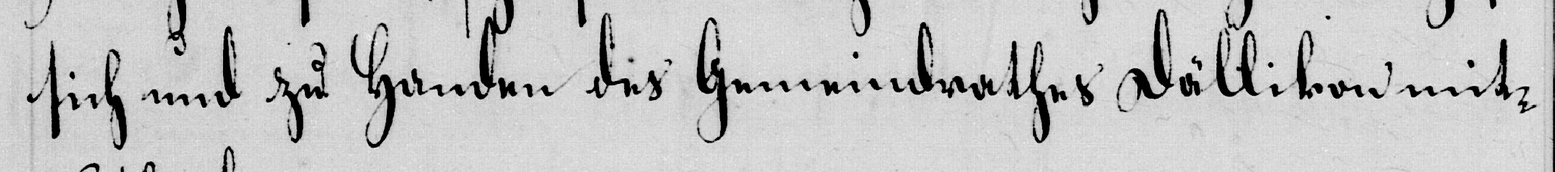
sich und zu Handen des Gemeindrathes Dällikon mit¬
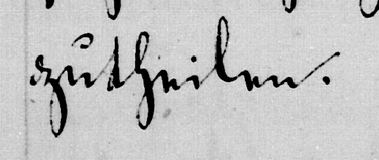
zutheilen.
